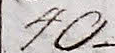40
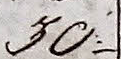30
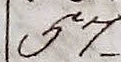57
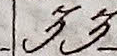33
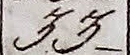33
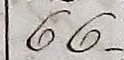66
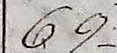69
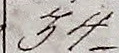34
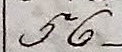56
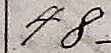48
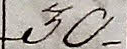30
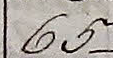65
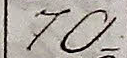70
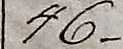46
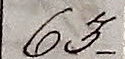63
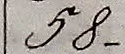58
